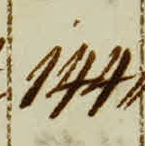144
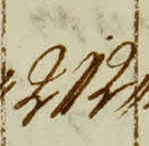212
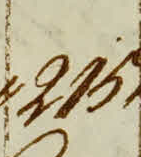215
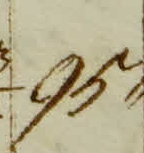95
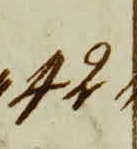42
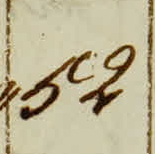52
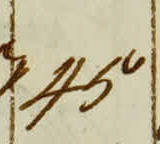45
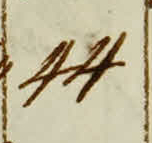44
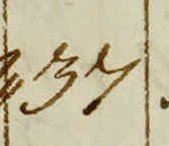37
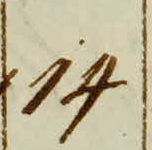14
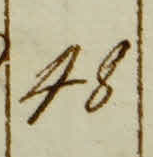48
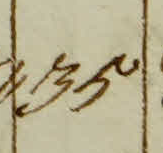35
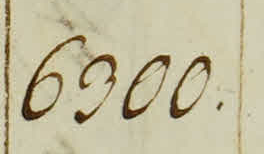6300.
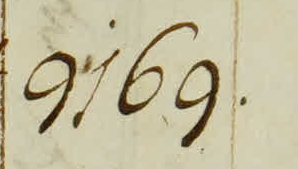9169.
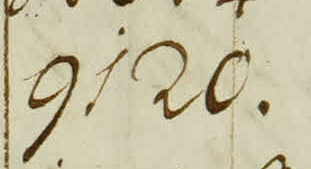9120.
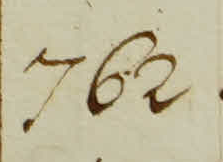762
